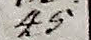45
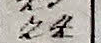24
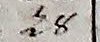28
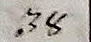38
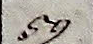59
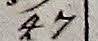47
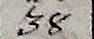38
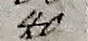40
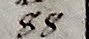88
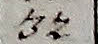32
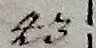43
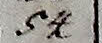54
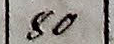80
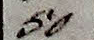50
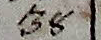38
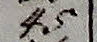45
